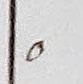0
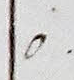0
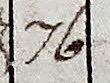76
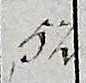52
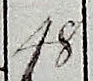48
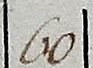60
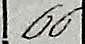66
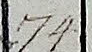74
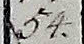54
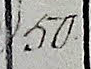50
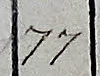77
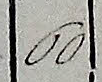60
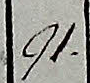91.
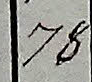78
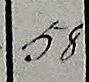58
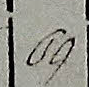69
